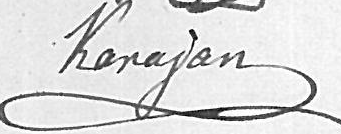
Karajan
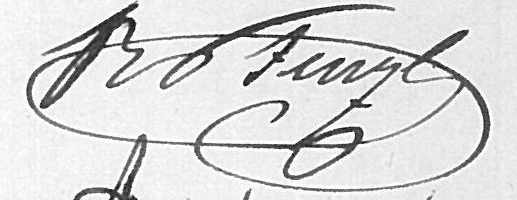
Ed Fenzl
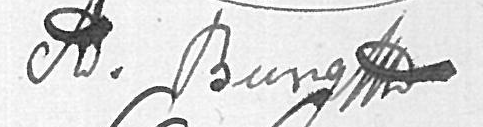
A. Burg
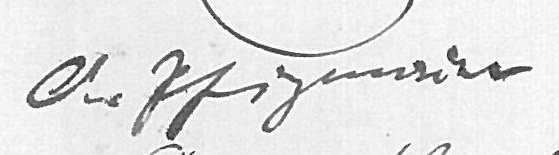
A.Pfizmaier
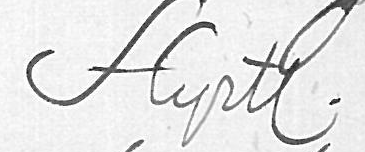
Hyrtl
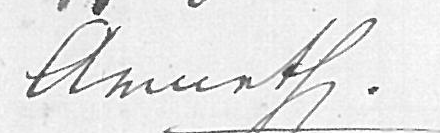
Arneth
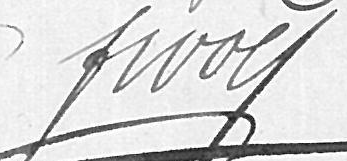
FWolf
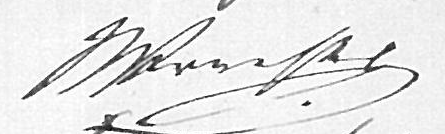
Prechtl
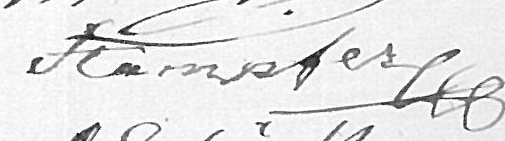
Stampfer
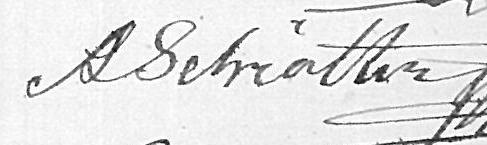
ASchrötter
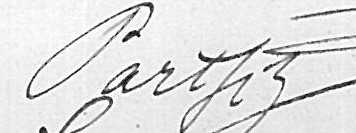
Partsch
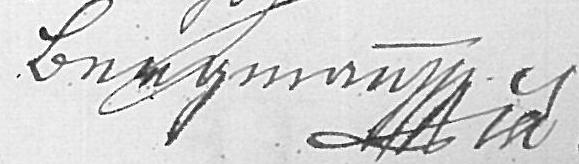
Bergmann
